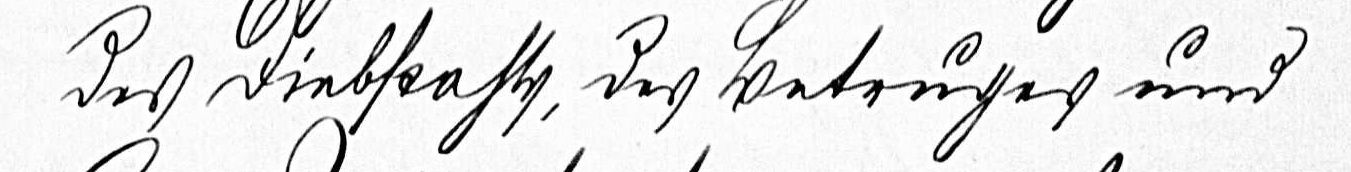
des Diebstahles, des Betruges und
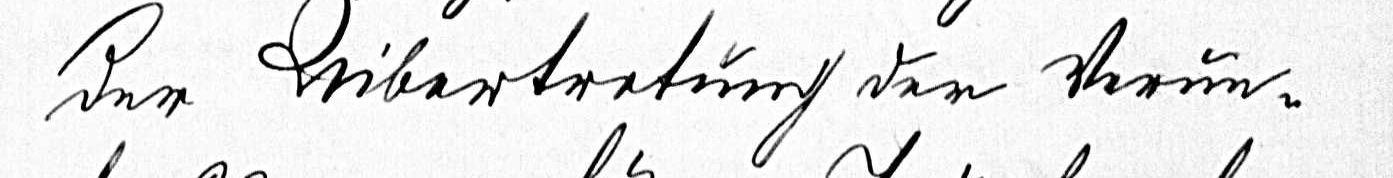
der Uibertretung der Verun¬
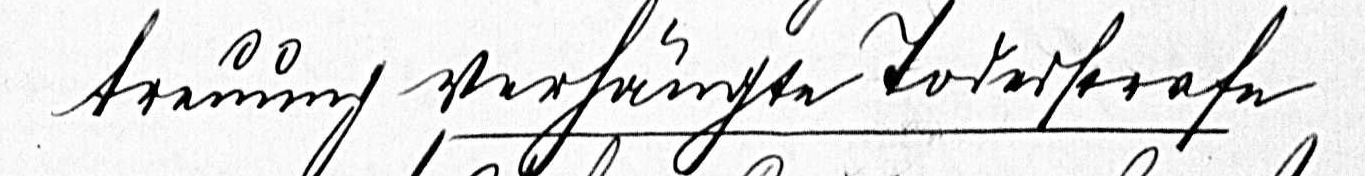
trauung verhängte Todesstrafe
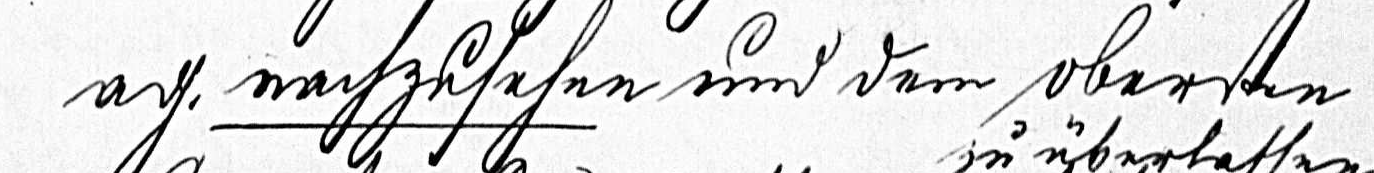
ag. nachzusehen und dem obersten
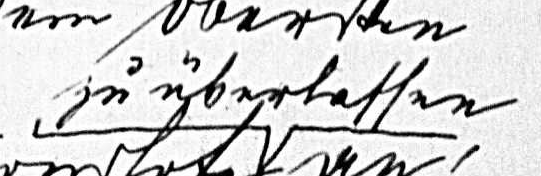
zu überlassen,
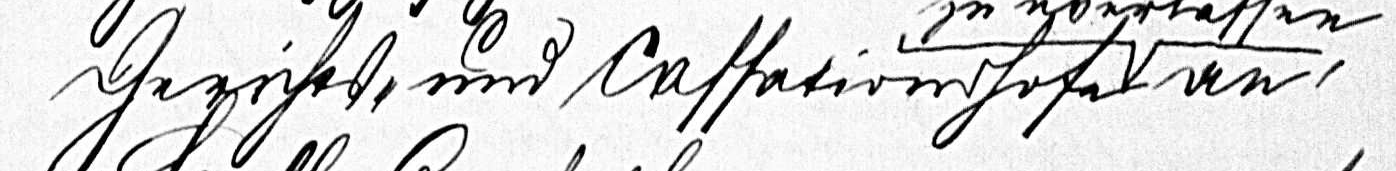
Gerichts- und Cassationshofe an
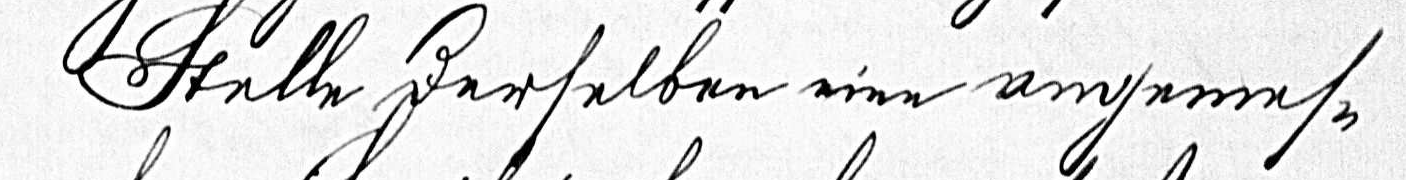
Stelle derselben eine angemes¬
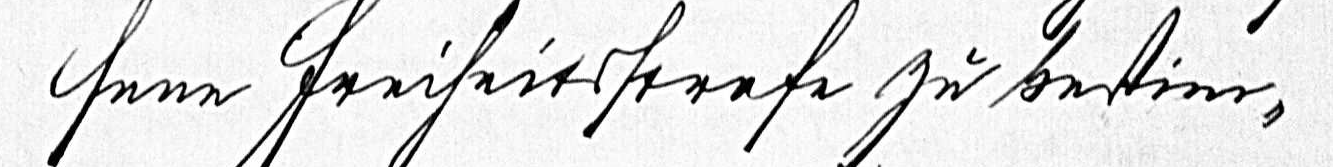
sene Freiheitsstrafe zu bestim¬
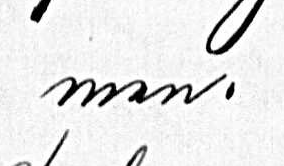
men.
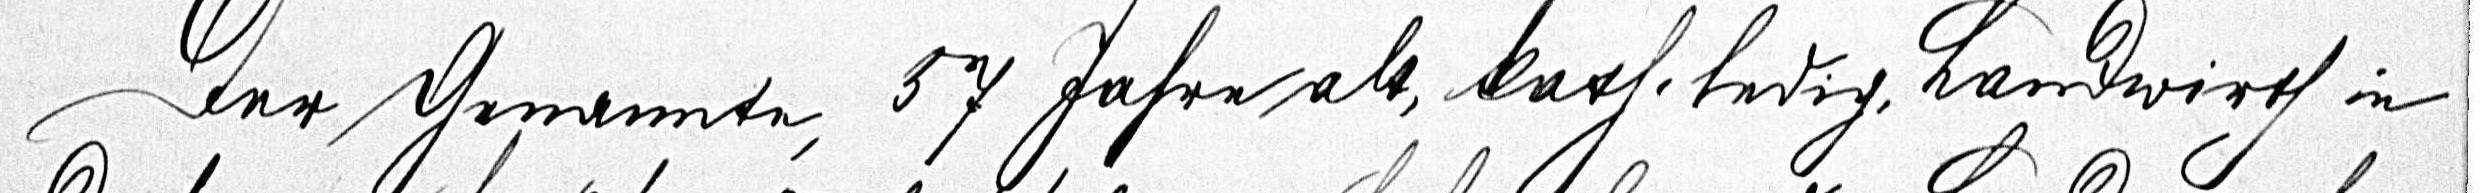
Der Genannte, 57 Jahre alt, kath. Ledig, Handwirth in
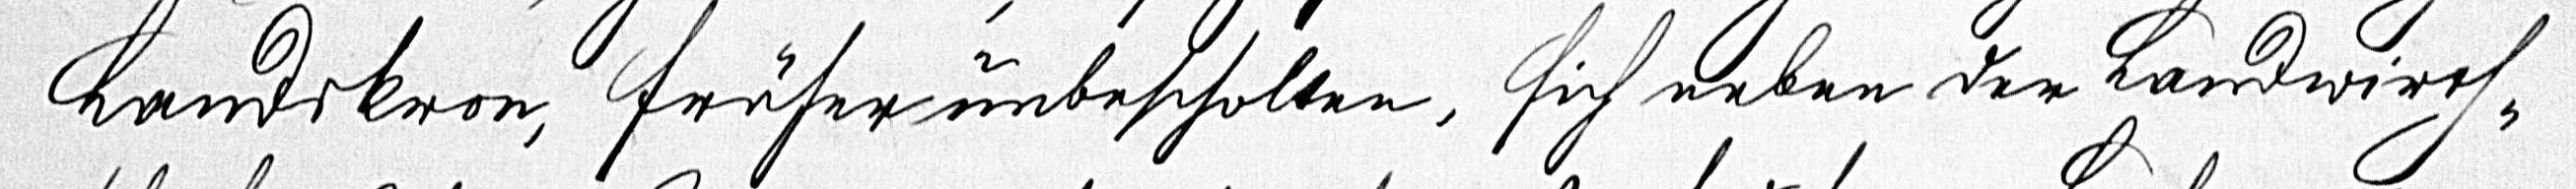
Landskron, früher unbescholten, sich neben der Handwirth¬
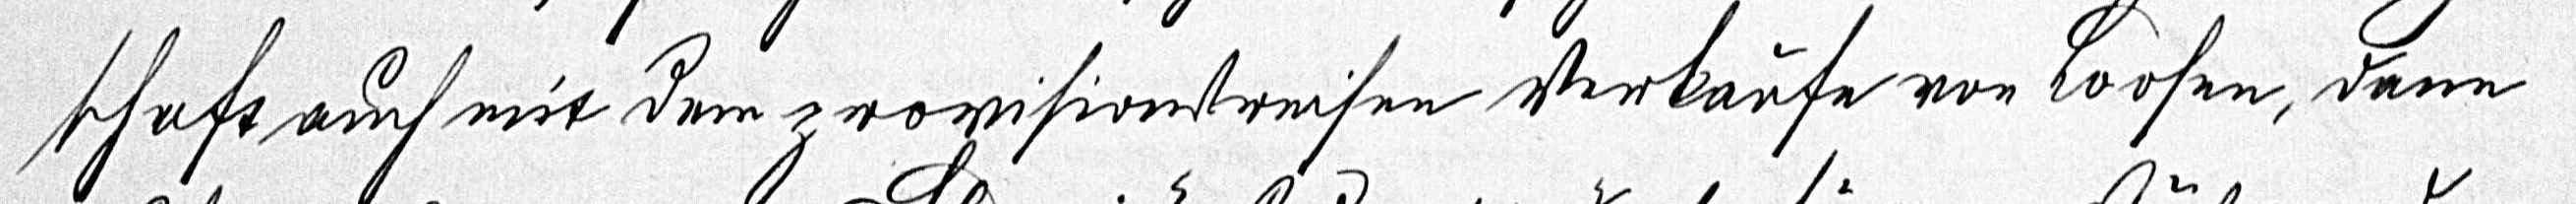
schaft auch mit dem provisionsweisen Verkaufe vom Loosen, denn
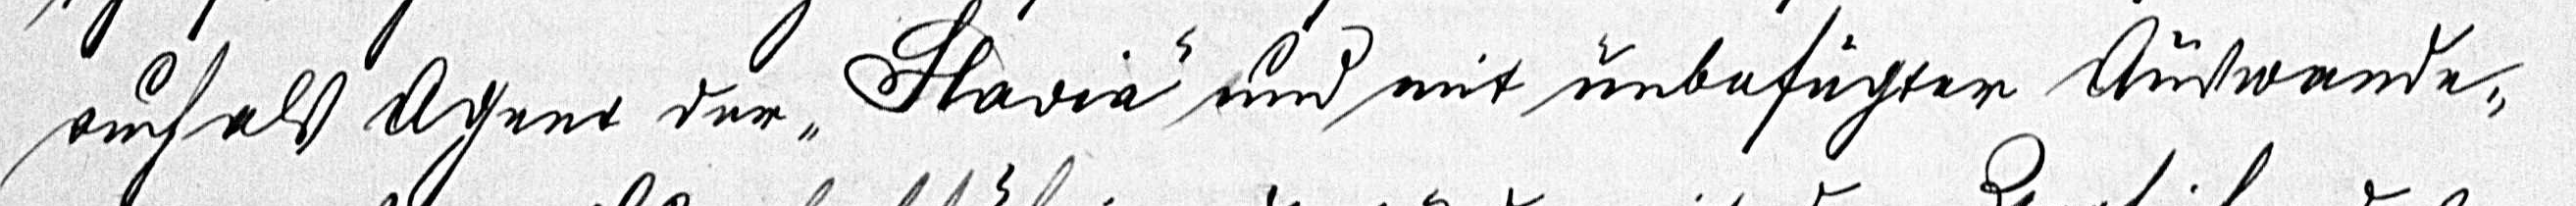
Agent der „Havia“ [Slavia?] und mit unbefügter Auswande¬
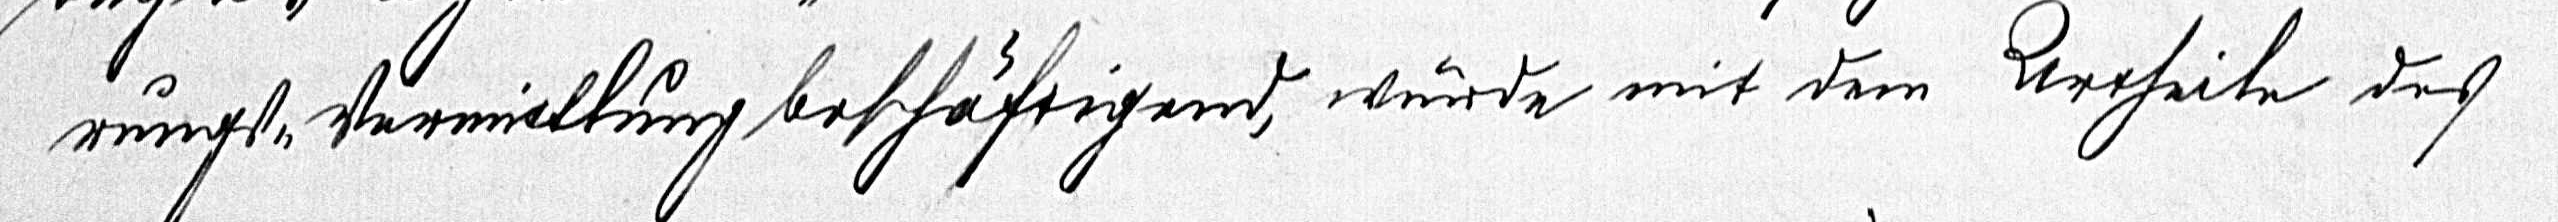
rungs-Vermittlung beschäftigend, wurde mit dem Urtheile des
